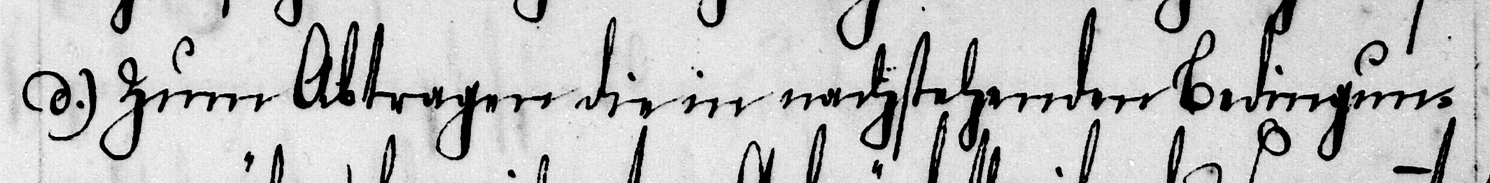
d.) Zum Abtragen die in nachstehenden Bedingun¬
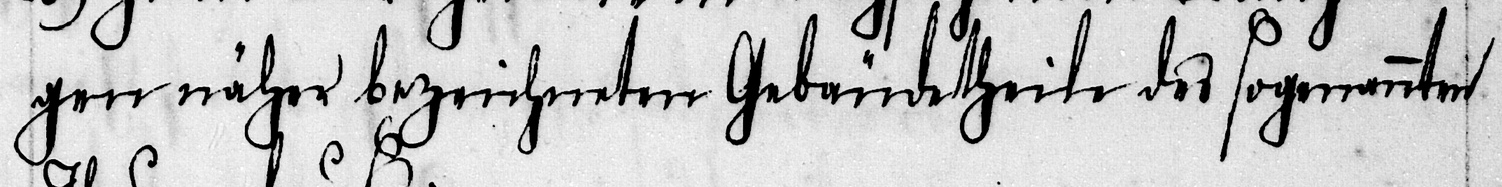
gen näher bezeichneten Gebäudetheile des sogenannten
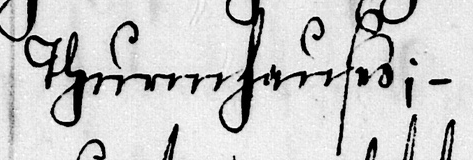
Thurmhauses; –
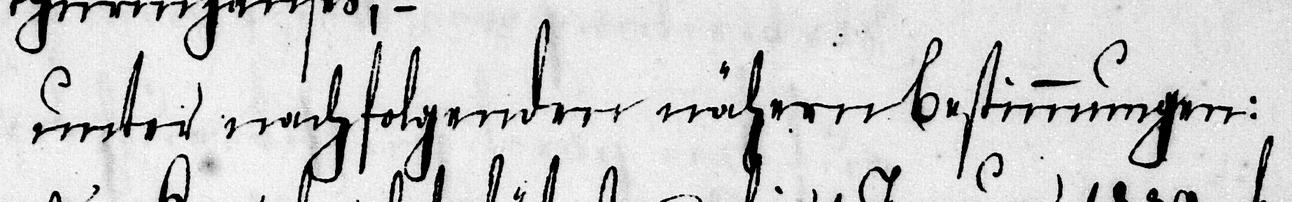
unter nachfolgenden nähern Bestimmungen:
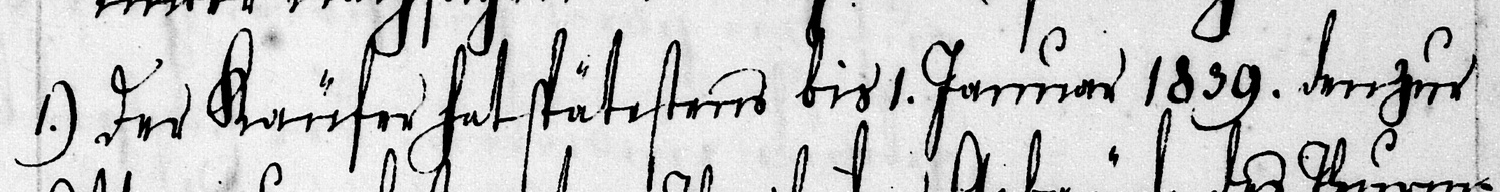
1.) Der Käufer hat spätestens bis 1. Januar 1839. den zur
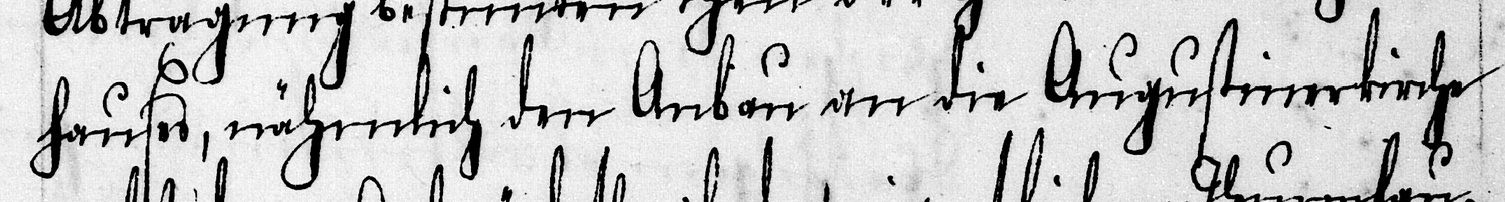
hauses, nähmlich den Anbau an die Augustinerkirche
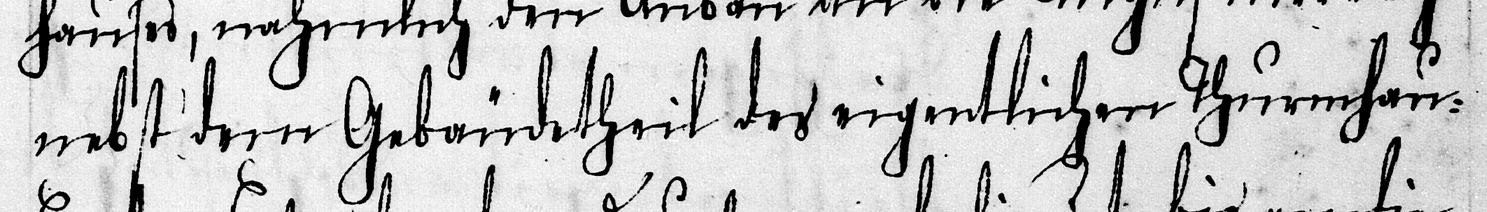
nebst dem Gebäudetheil des eigentlichen Thurmhau¬
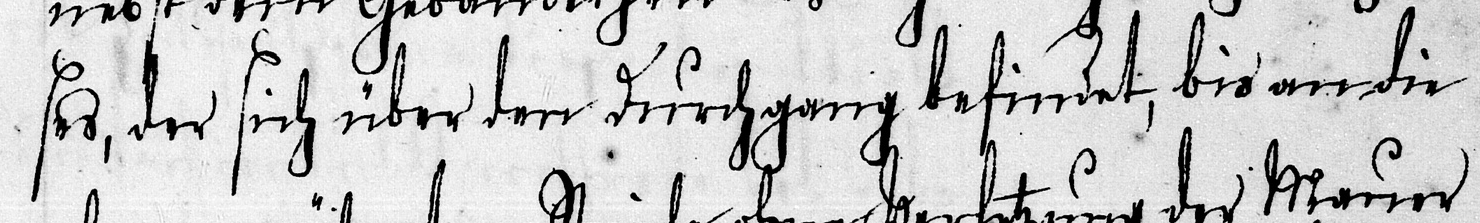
ses, der sich über den Durchgang befindet, bis an die
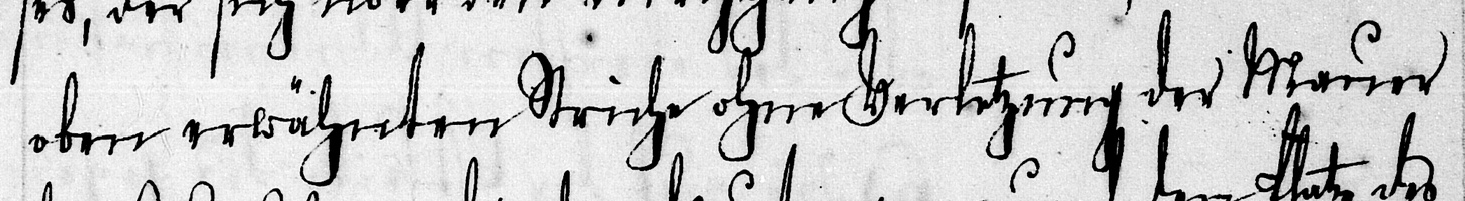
oben erwähnten Striche ohne Verletzung der Mauer
